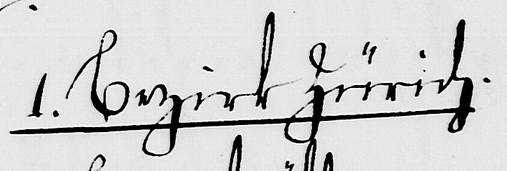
1. Bezirk Zürich.
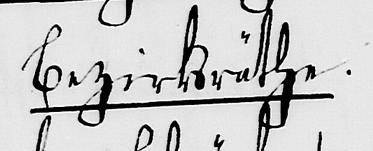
Bezirksräthe.
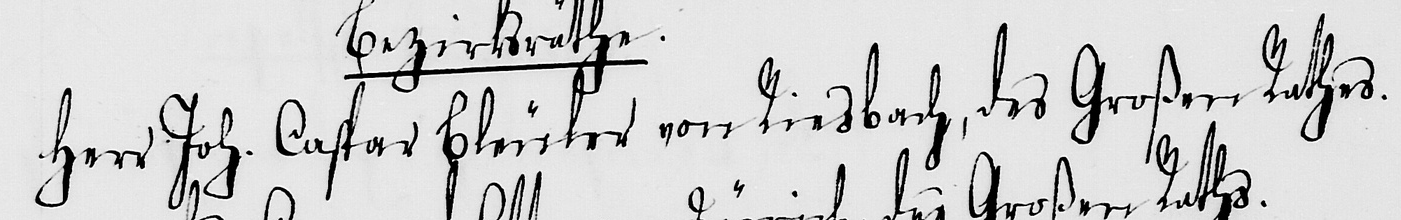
Herr Joh. Caspar Bleuler von Riesbach, des Großen Rathes.
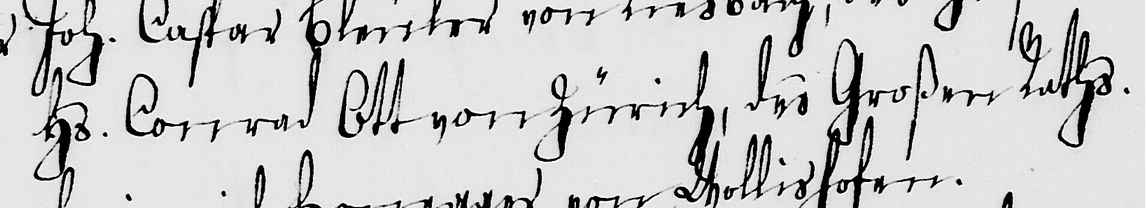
Hs. Conrad Ott von Zürich, des Großen Raths.
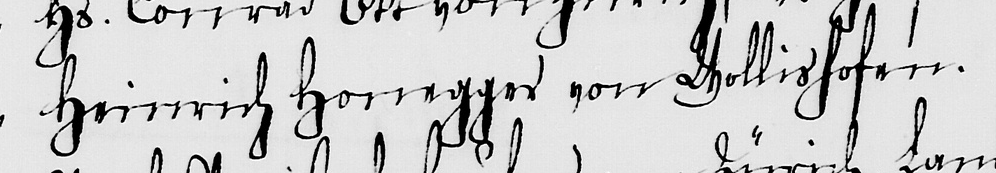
Heinrich Honegger von Wollishofen.
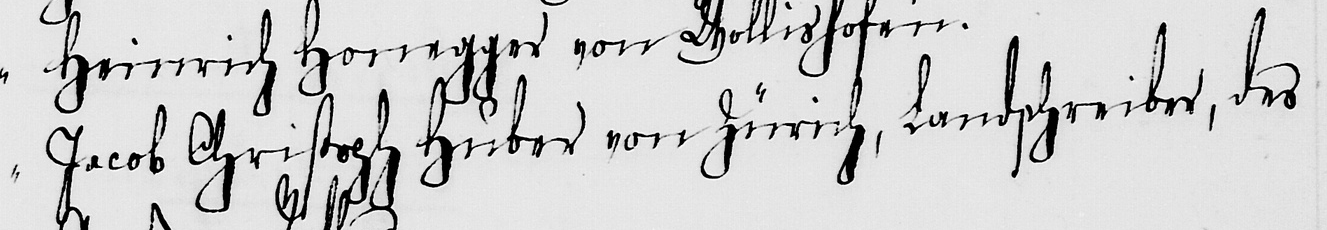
Jacob Christoph Huber von Zürich, Landschreiber, des
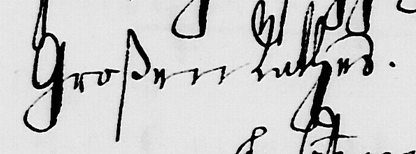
Großen Rathes.
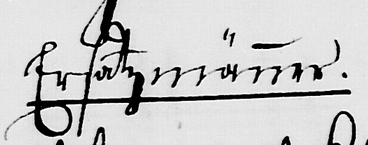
Ersatzmänner.
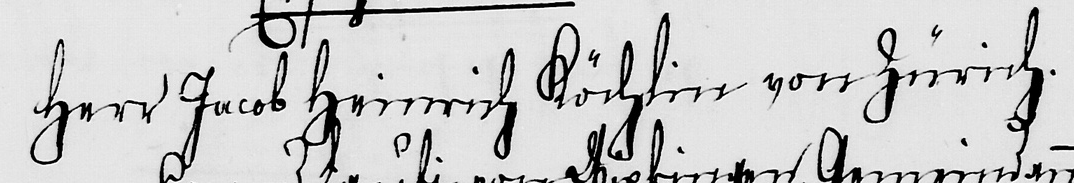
Herr Jacob Heinrich Köchlin von Zürich.
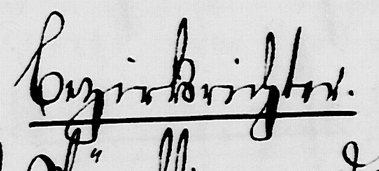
Bezirksrichter.
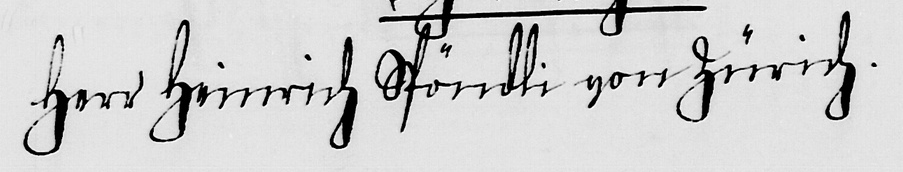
Herr Heinrich Spöndli von Zürich.
